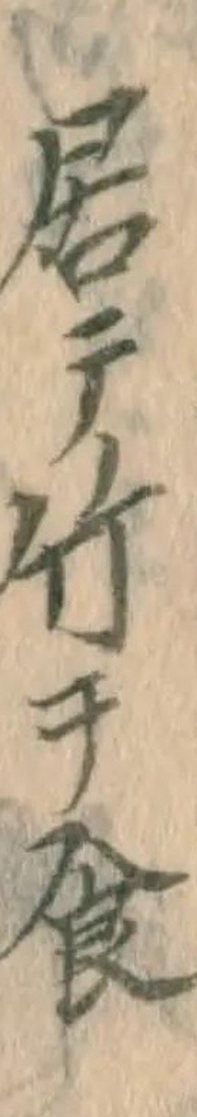居テ竹ヲ食
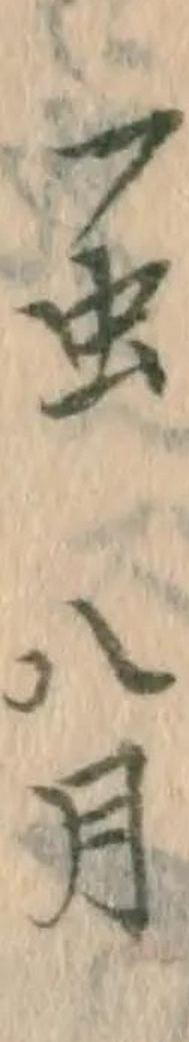フ虫八月
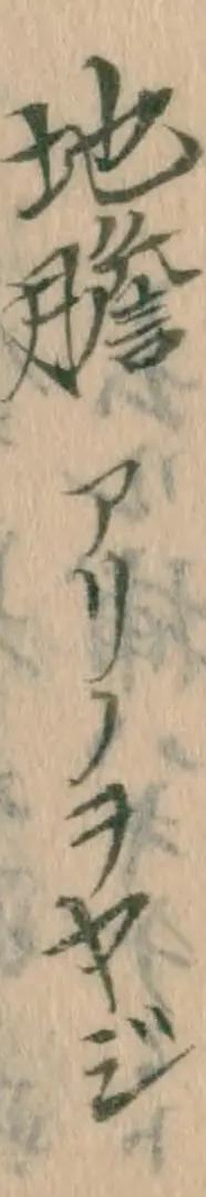地膽アリノヲヤジ
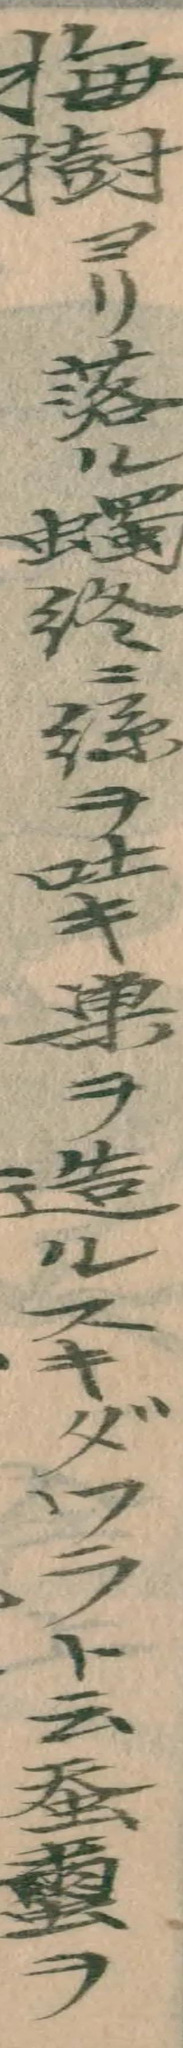梅樹ヨリ落ル蠋終ニ絲ヲ吐キ巣ヲ造ルスキダワラト云蚕蠒ヲ
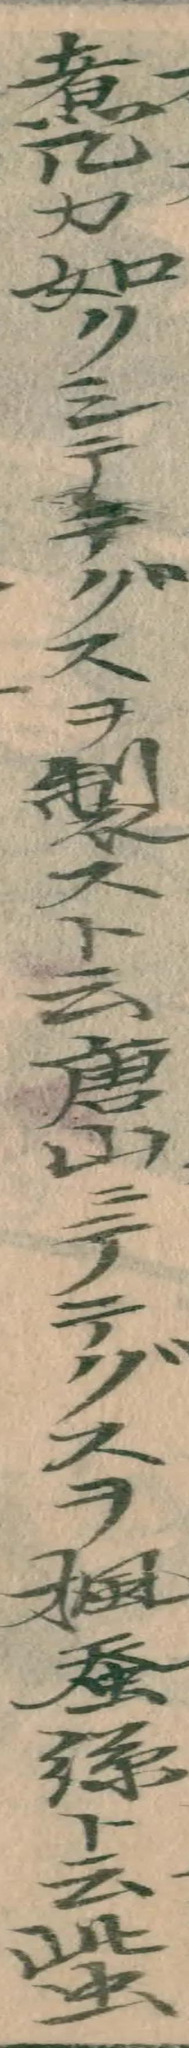煮几カ如クシテテグスヲ製スルト云唐山ニテテグスヲ楓蚕絲ト云此虫
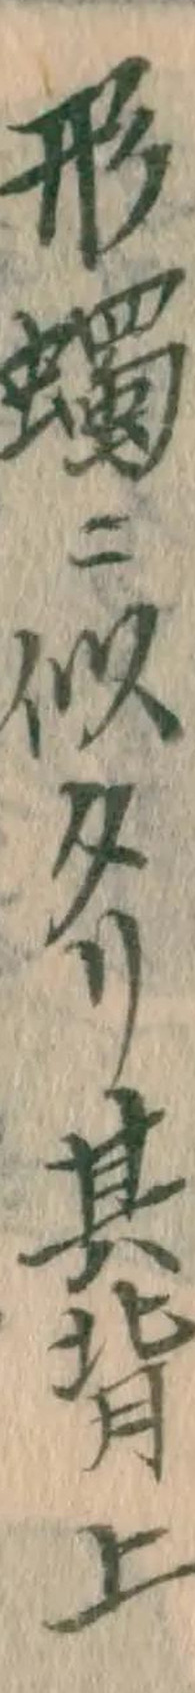形蠋ニ似タリ其背上
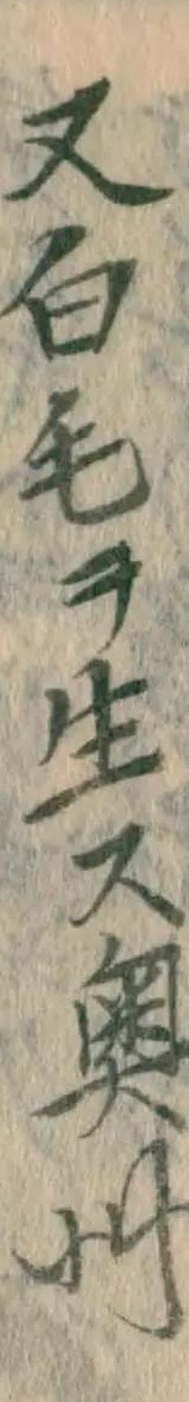又白毛ヲ生ス奥州
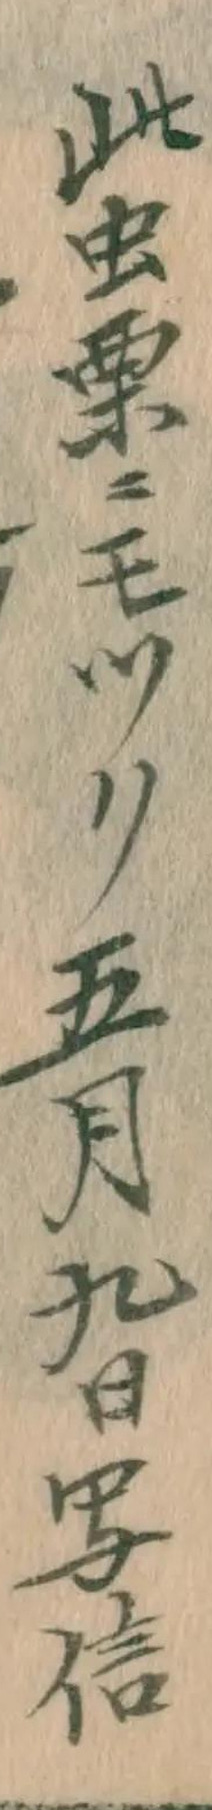此虫栗ニモツク五月九日写信
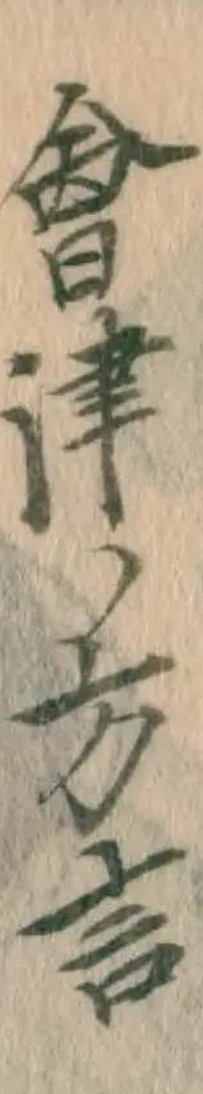會津ノ方言
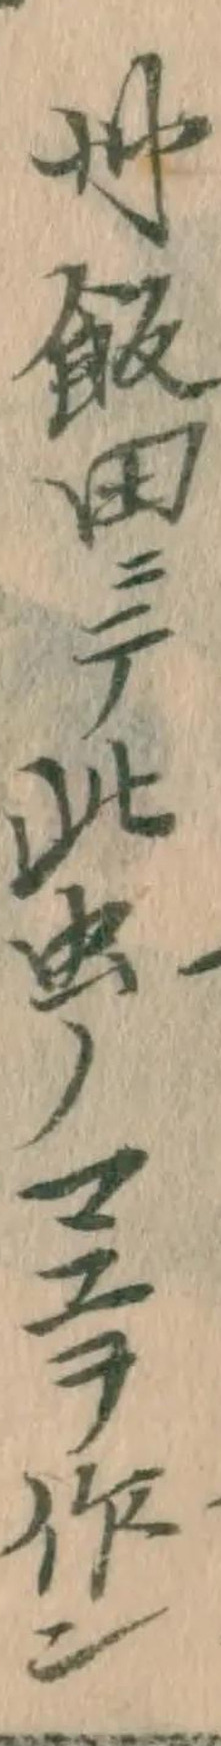州飯田ニテ此虫ノマユヲ作ン
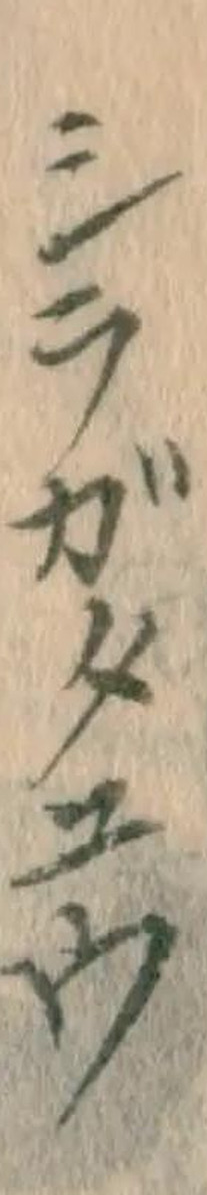シラガタユウ
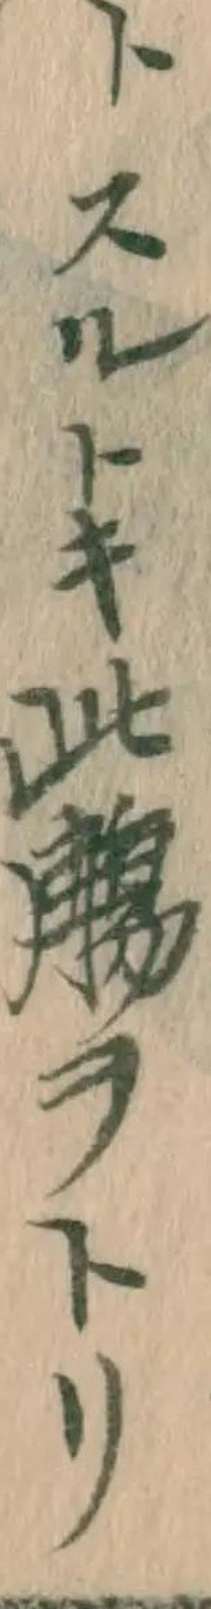トスルトキ此膓ヲトリ
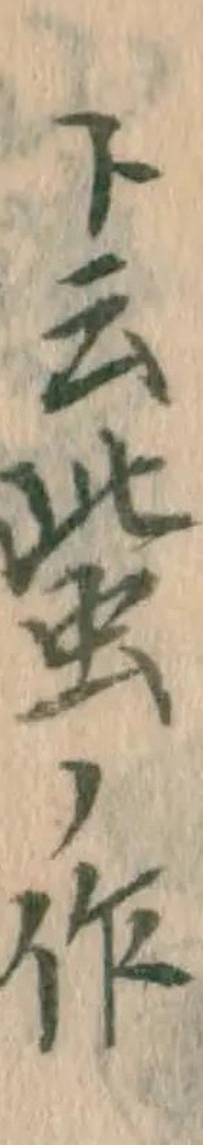ト云此虫ノ作
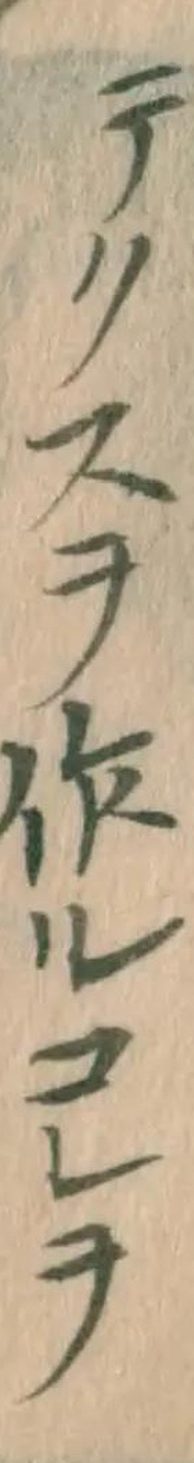テクスヲ作ルコレヲ
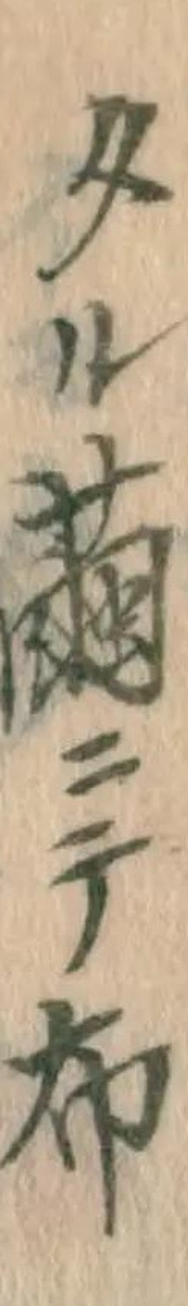タル繭ニテ布
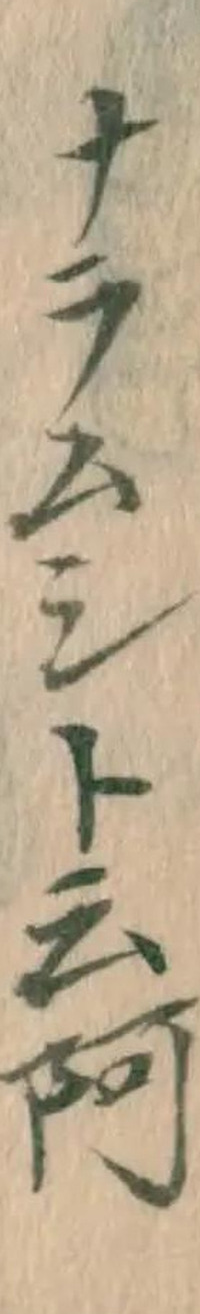ナラムシト云阿
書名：千蟲譜 3巻. [2]
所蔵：国立国会図書館 National Diet Library, JAPAN
